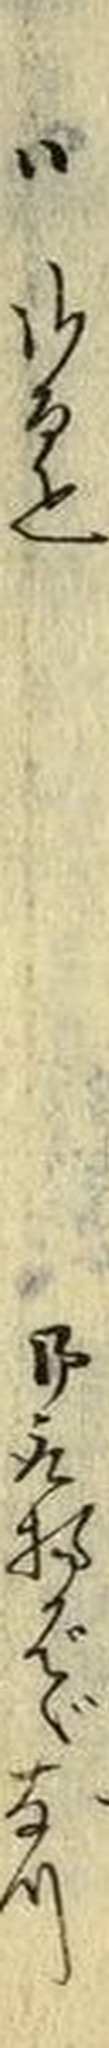同弐百疋御取揚ばヾなつ
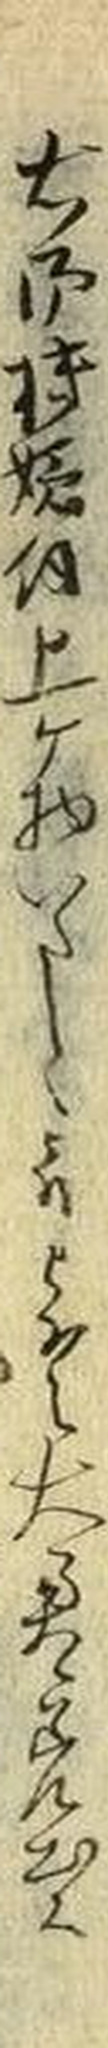右御機嫌伺上ケ物いたし候ニ付被下之大奥へ差出ス
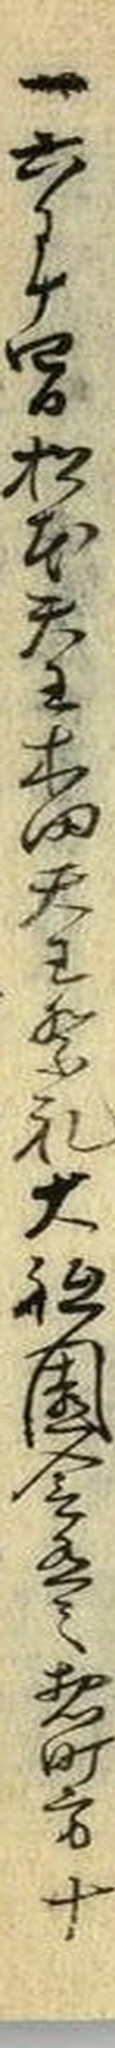一六月十四日松本天王木田天王祭礼大祇園会有之惣町方十
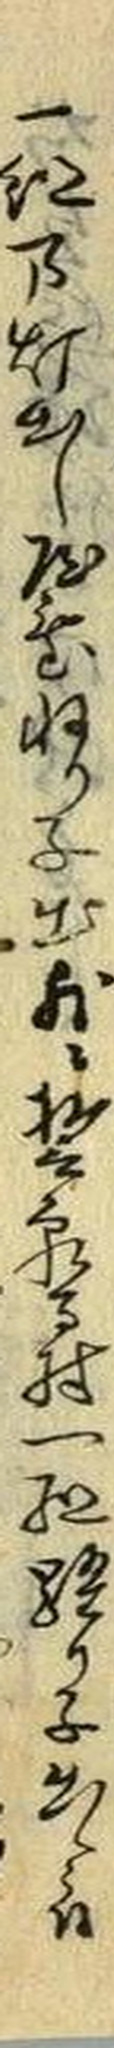一組万灯出し屋台ねり子出外ニ誓願寺村一組踊り子出候ニ付
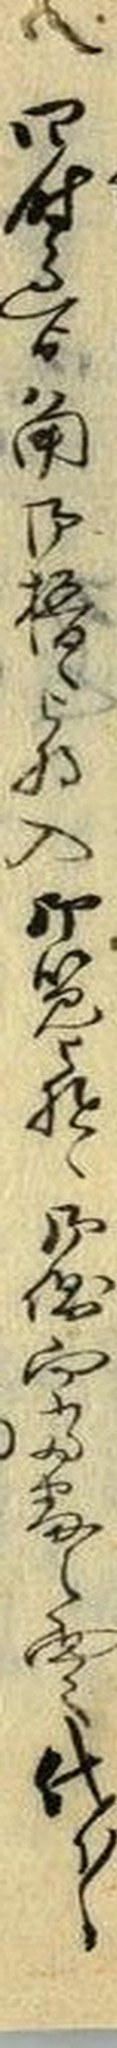四時過ゟ角御櫓へ被為入御覧被遊候御側向当番之面々代り〳〵
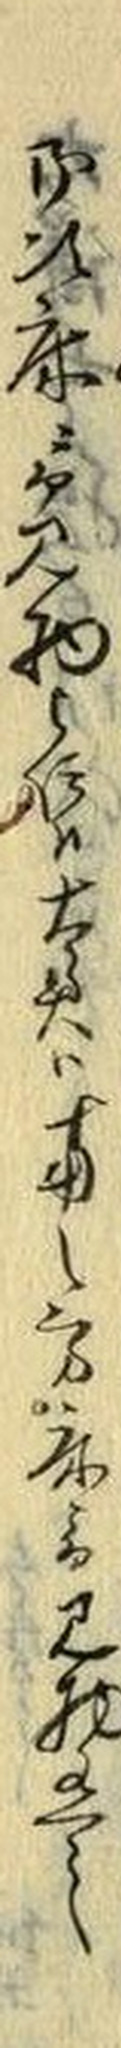御次床ニ而見物被仰付候大奥ハ南之方床ニ而見物有之
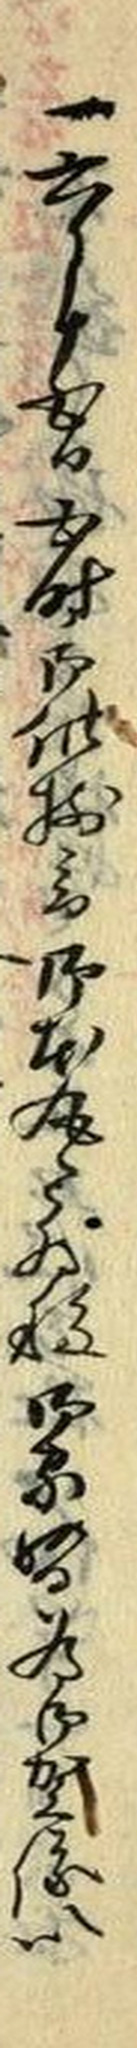一六月十五日五時御供揃ニ而御本丸被為移御家督為御賀俄以
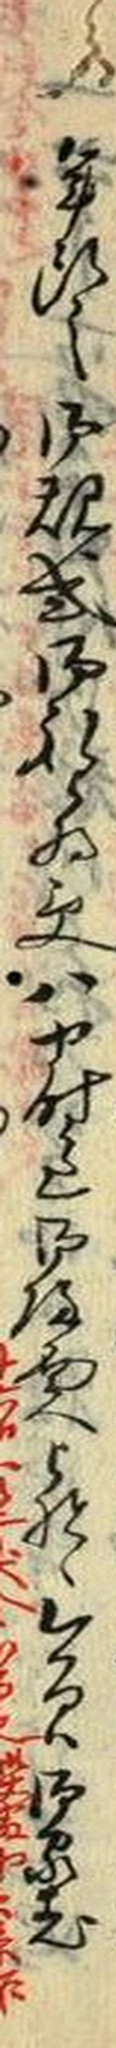年頭之御規式御礼被為受八半時過御帰殿被遊候今日ハ御家老
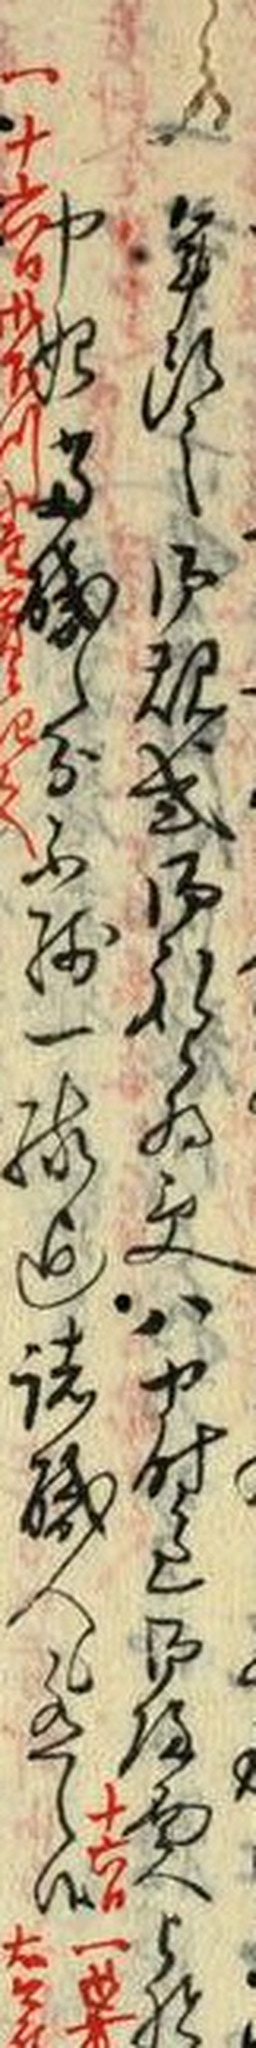中始当職之分不残一統迄諸職人も有之候
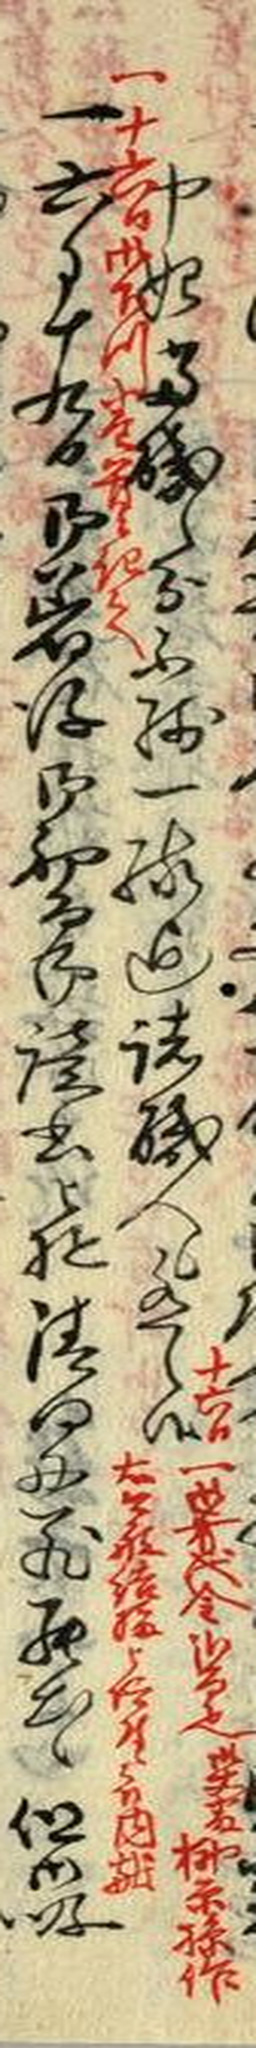一六月十九日御着後御初而御読書被遊清田丹蔵罷出候但御吸
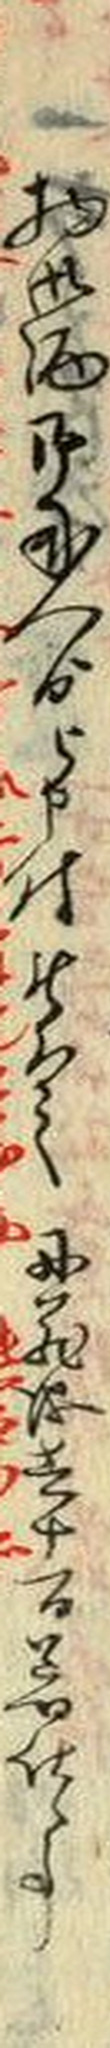物御酒御用人ゟ被申付被下之丹蔵儀去十一日着仕候事
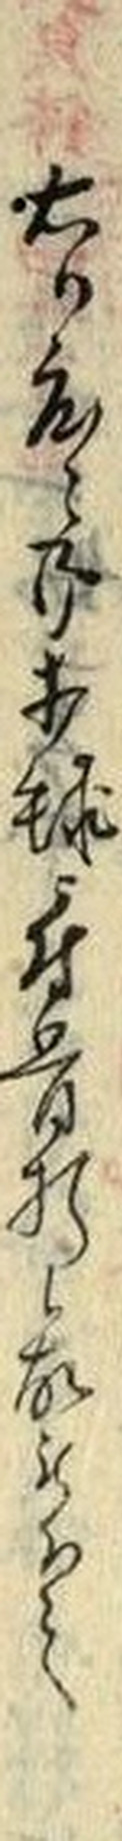右ハ度々御打毬ニ付骨折候故被下之
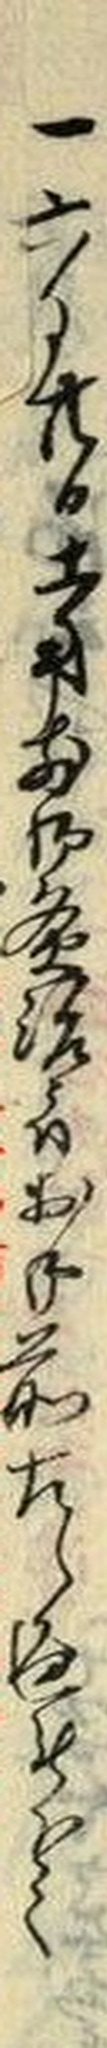一六月廿日土用前御灸治ニ付於御前左之通被下之
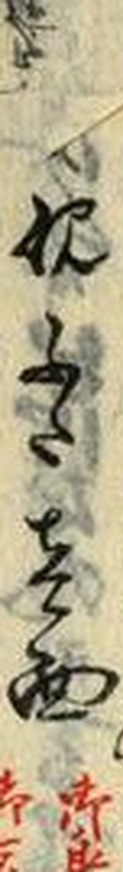硯ふた壱面
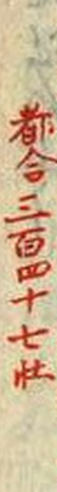都合三百四十七壮
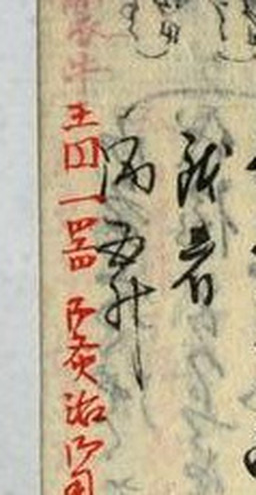酒五升
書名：少傅日録抄（斉承付側向頭取日記、在国）
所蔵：福井県文書館 Fukui Prefectural Archives
